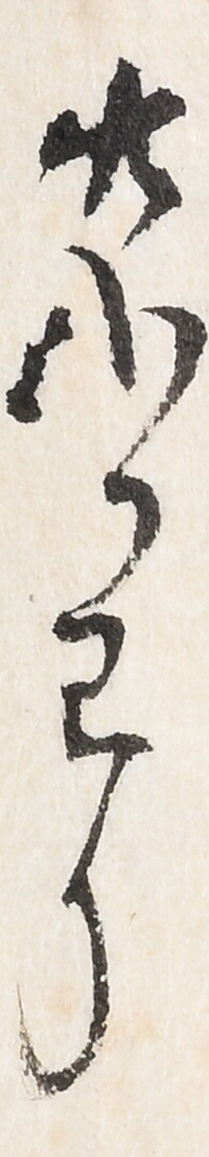廿弐かわり
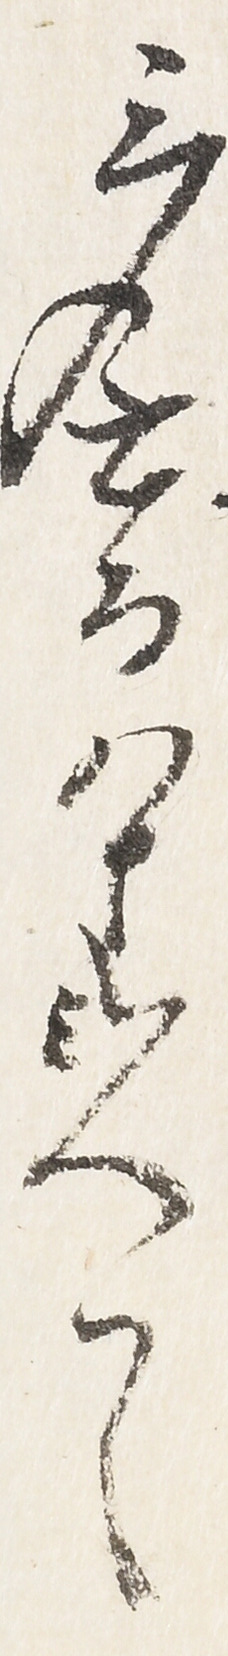三貫六百八十弐人ツヽ

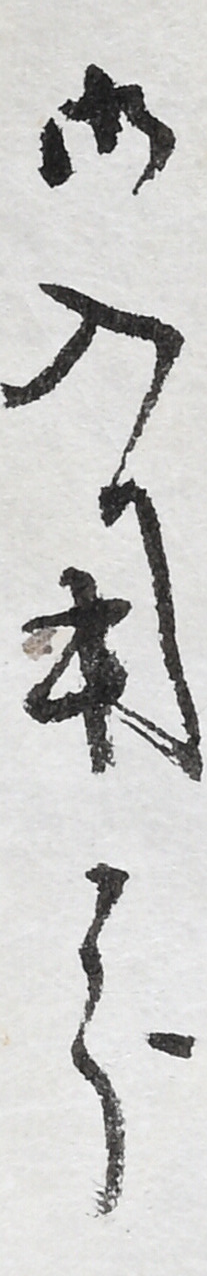御入用之
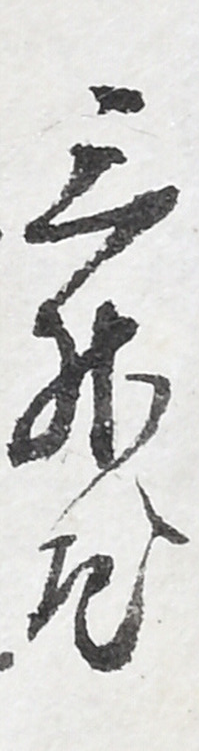三升屋
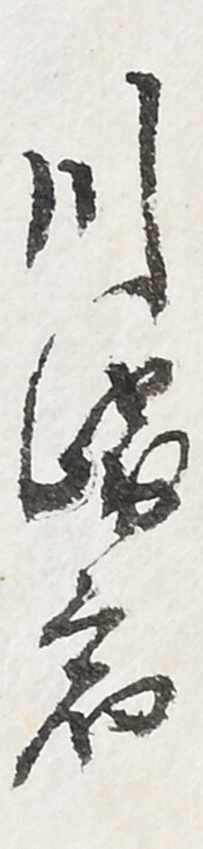川崎宿
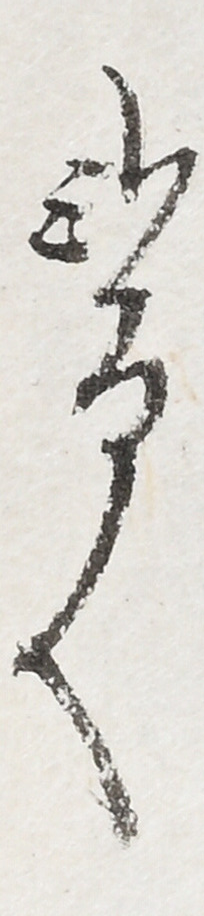弐百人
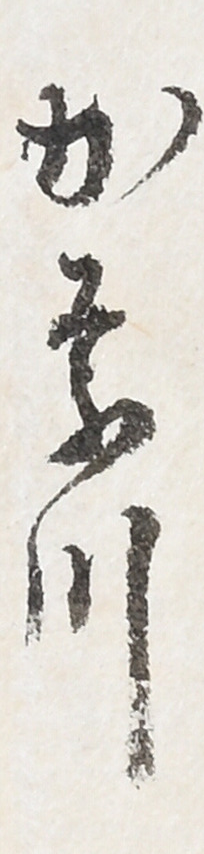か奈川
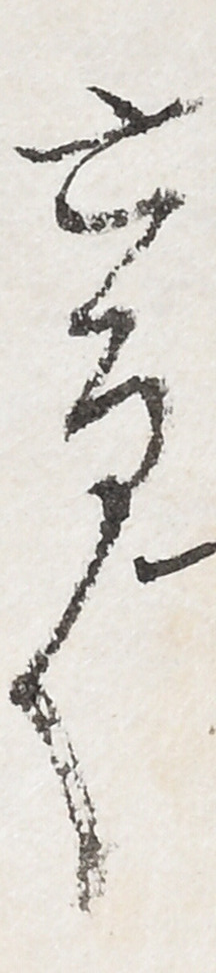六百文
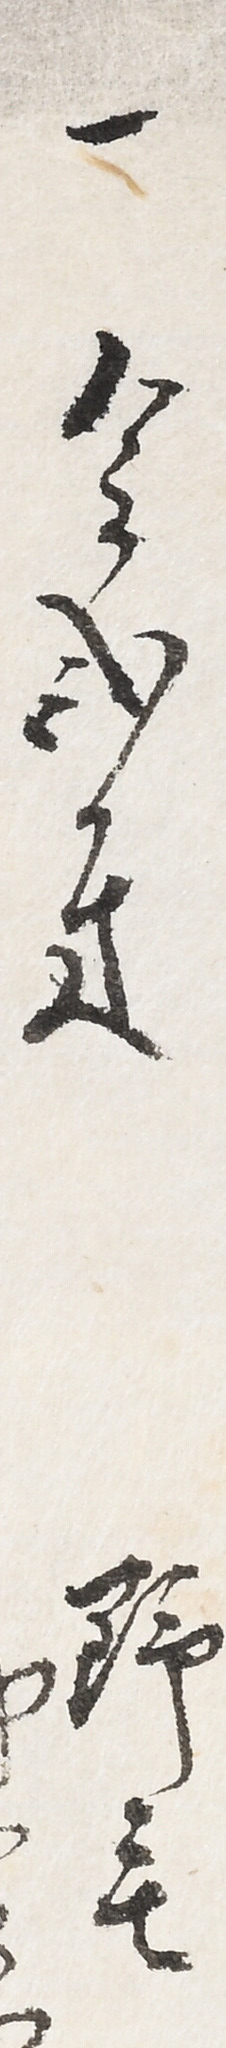一金弐朱川崎
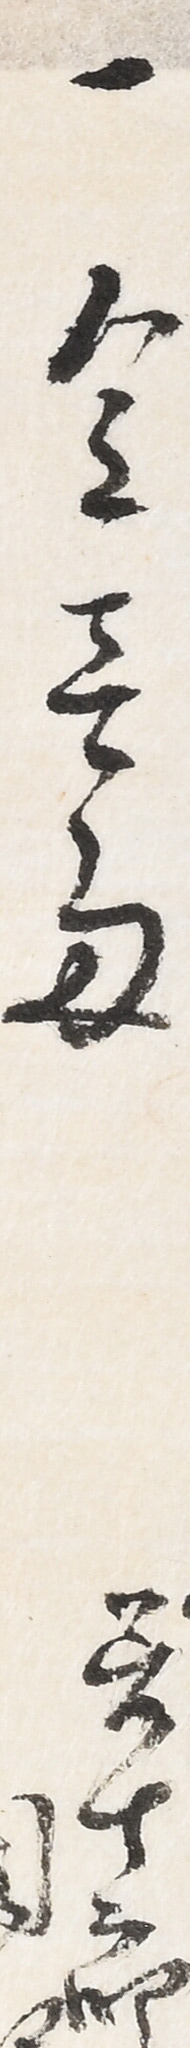一金弐朱善十郎
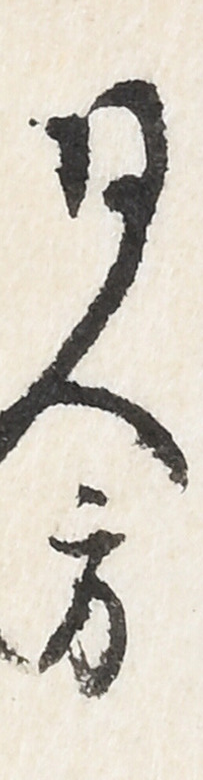同人方
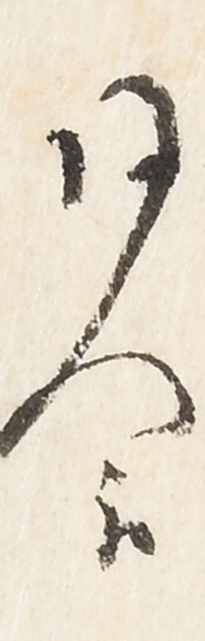同人方
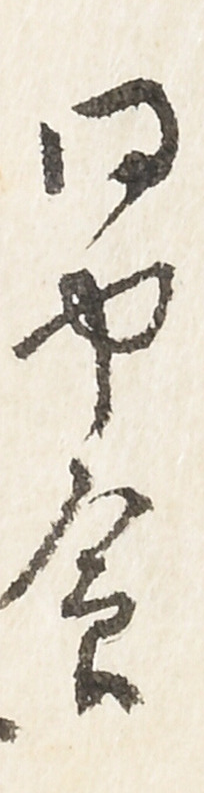同中食
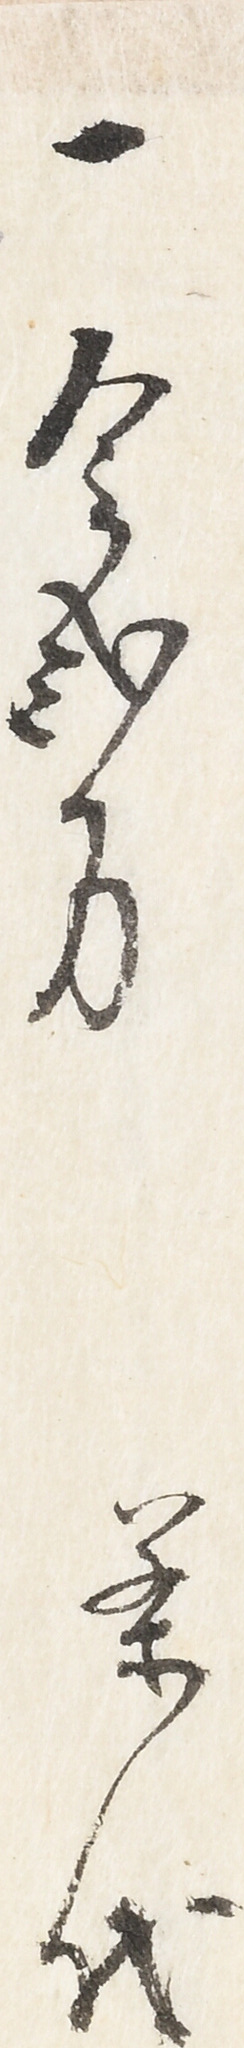一金弐分茶代
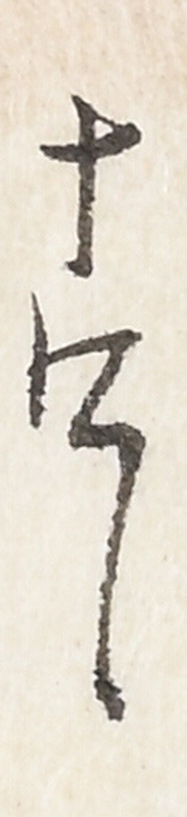十四日
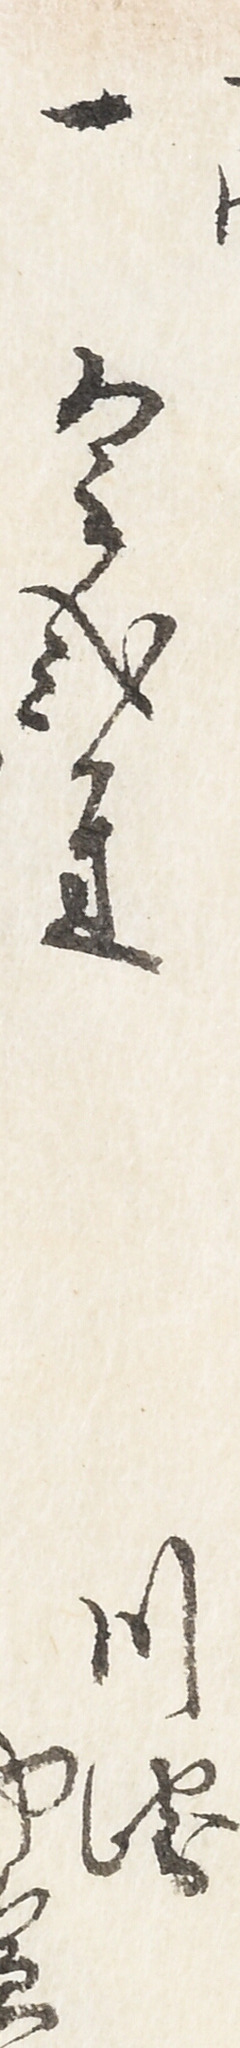一金弐朱川崎
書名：御上屋鋪逗留中雑用控
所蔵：伊那市立高遠町図書館・合同会社AMANE
